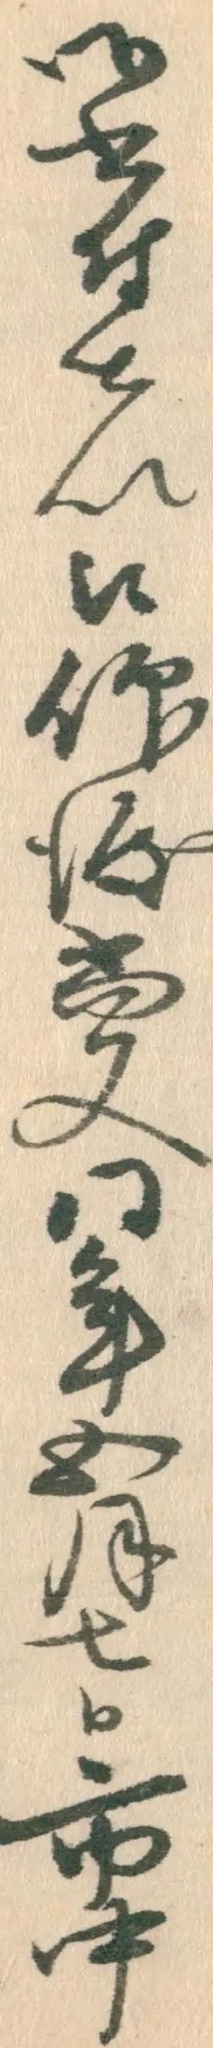御書付を以被仰渡尚又同年五月七日市中
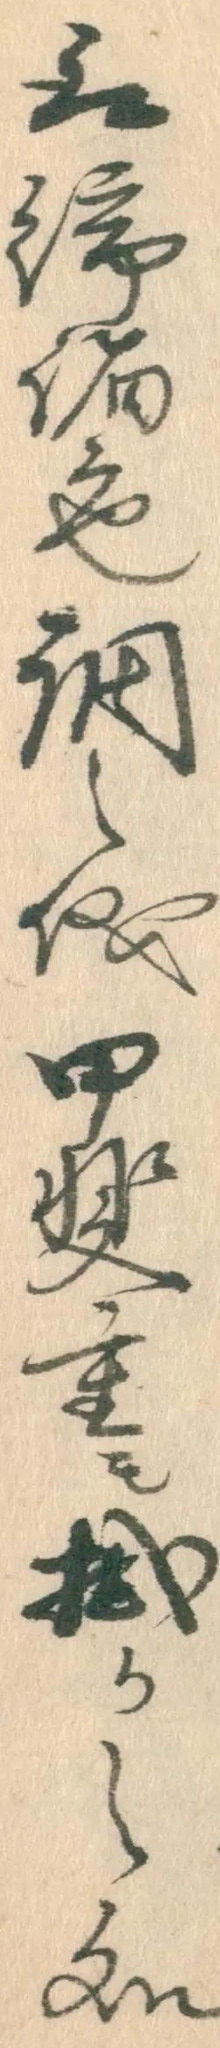取締諸色調之儀甲斐重モ掛り之処

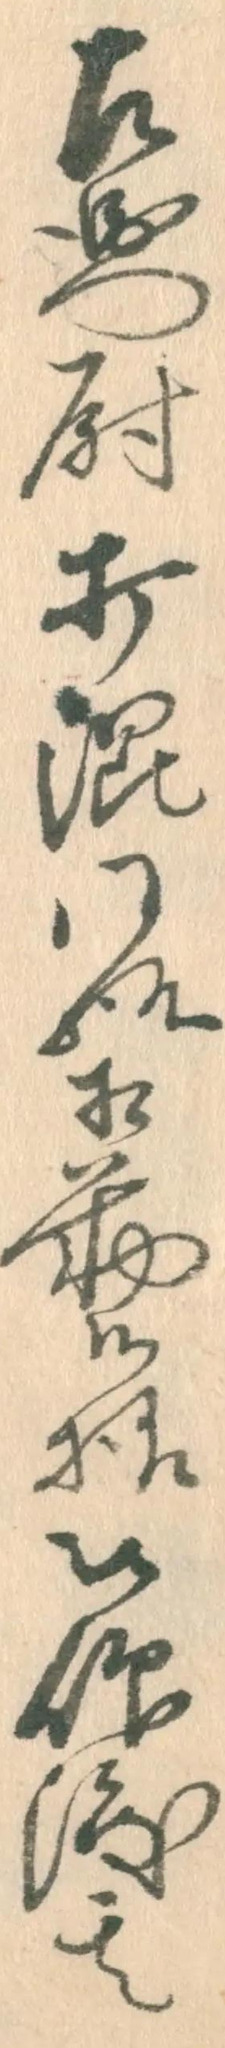左衛門尉打混同様相勤候様被仰渡其
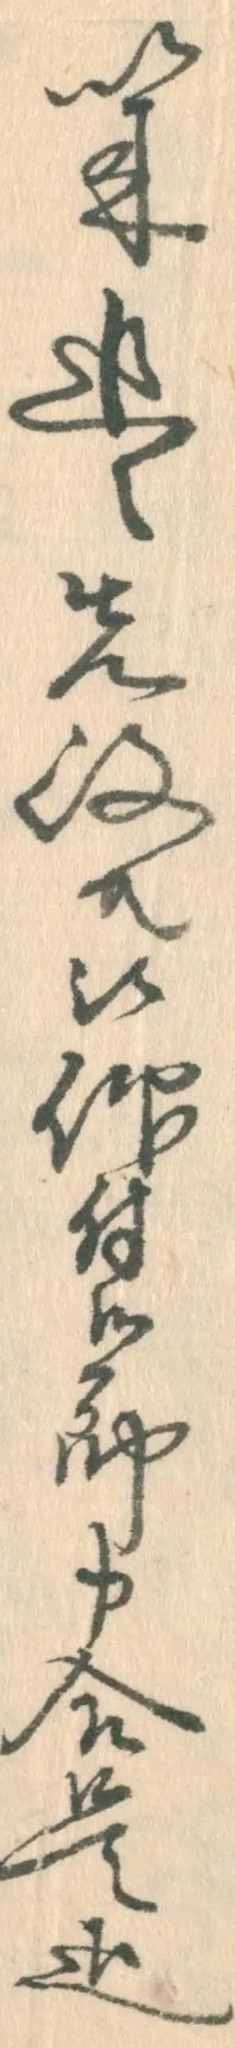以来追々先役共被仰付候節申合是迄
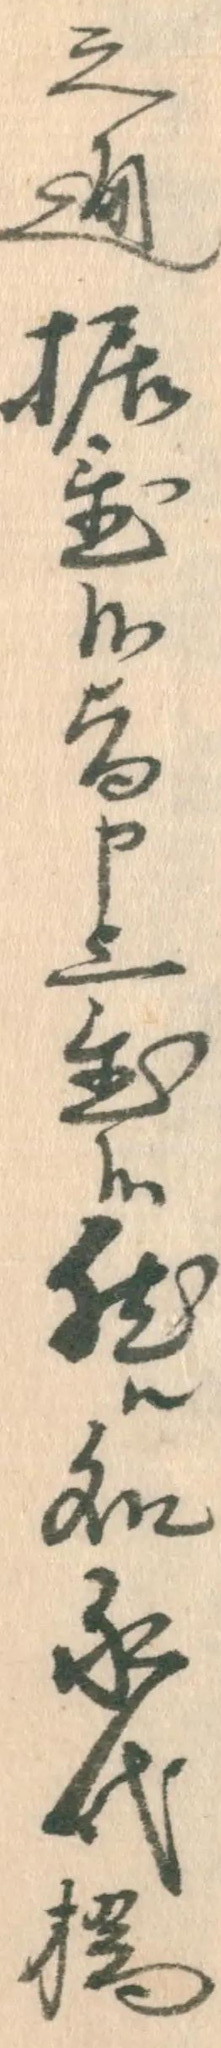之通据置候旨申上置候然ル処永代橋
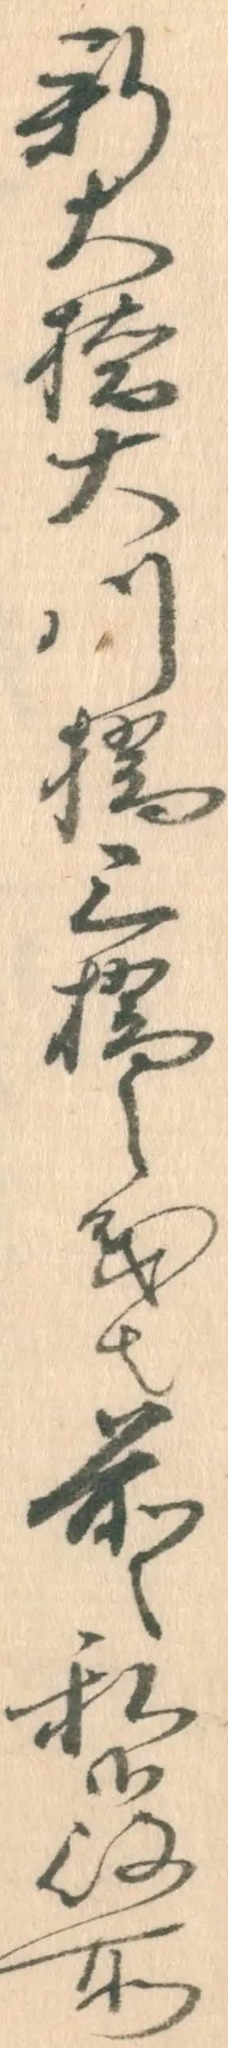新大橋大川橋三橋之義は前之私御役所
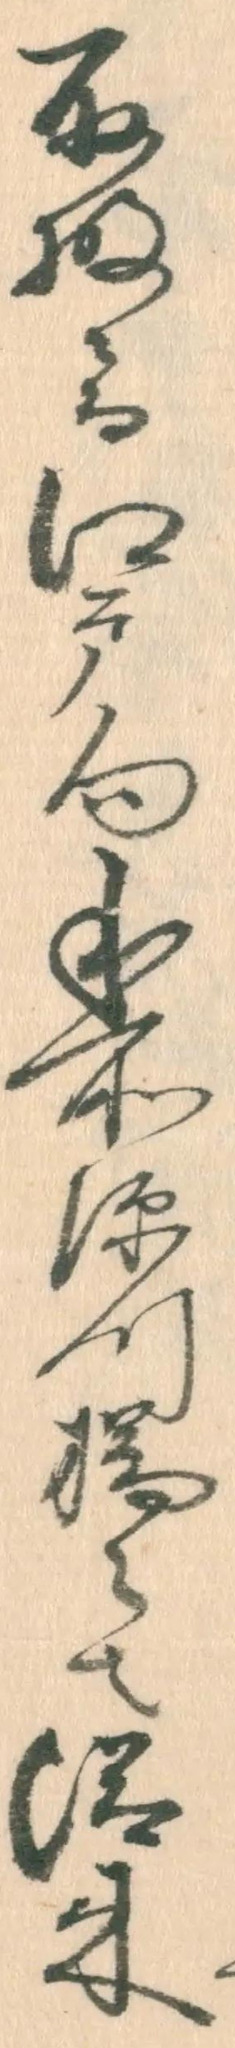取扱ニ而江戸向本所深川橋々は従来
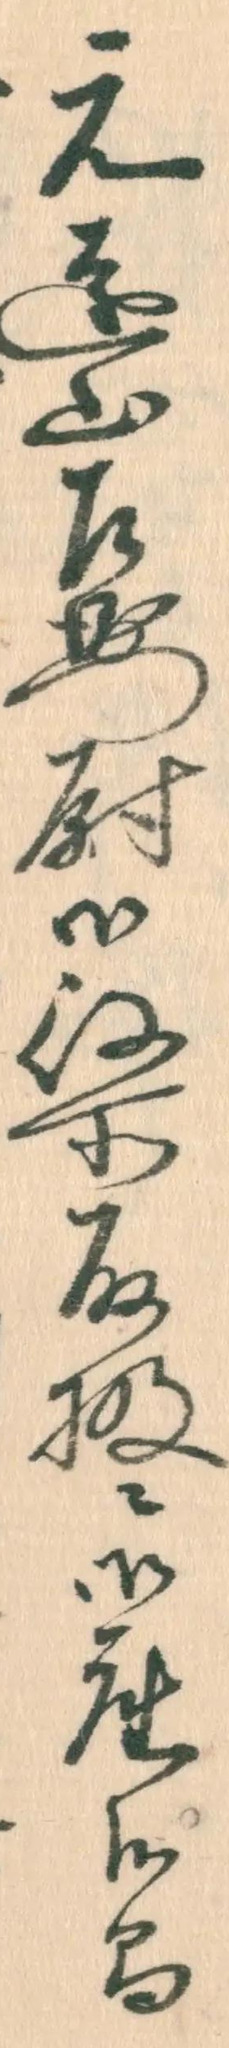元遠山左衛門尉御役所取扱ニ御座候間
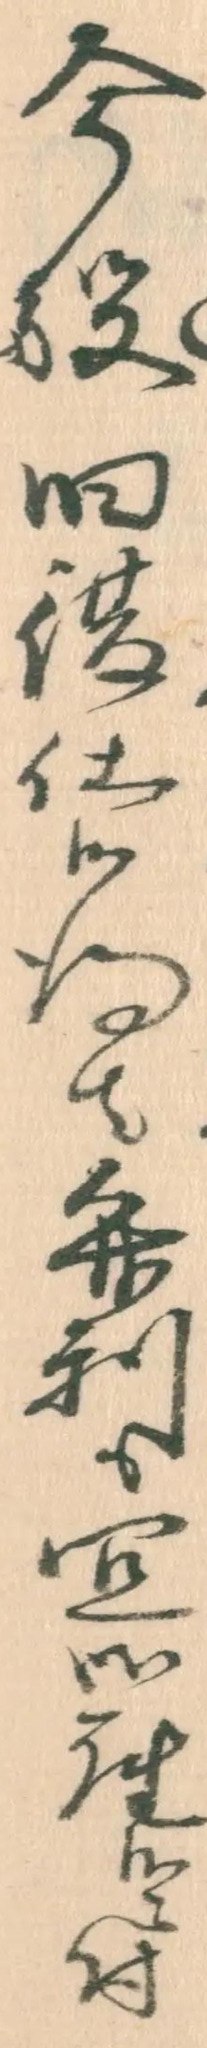今般旧復仕候得は弁利も宜御座候ニ付
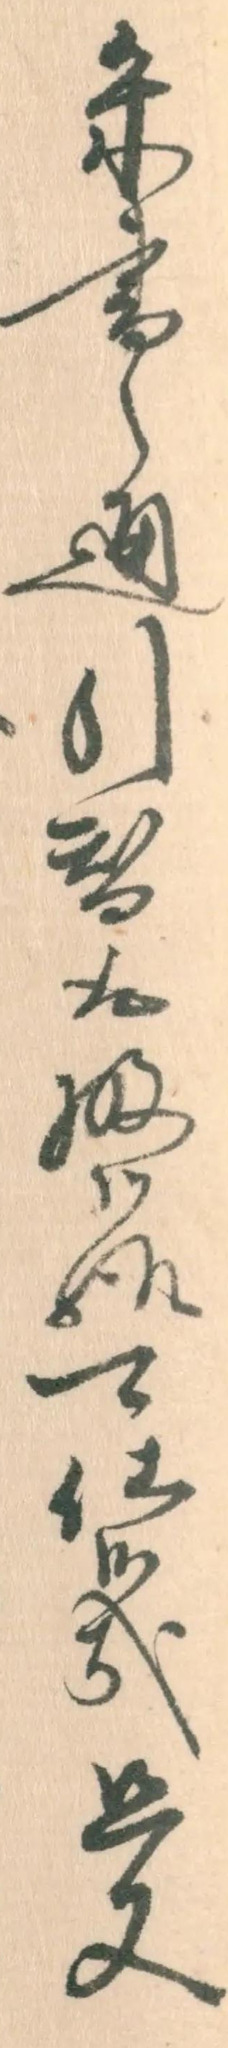朱書之通引替取扱候様可仕候哉且又
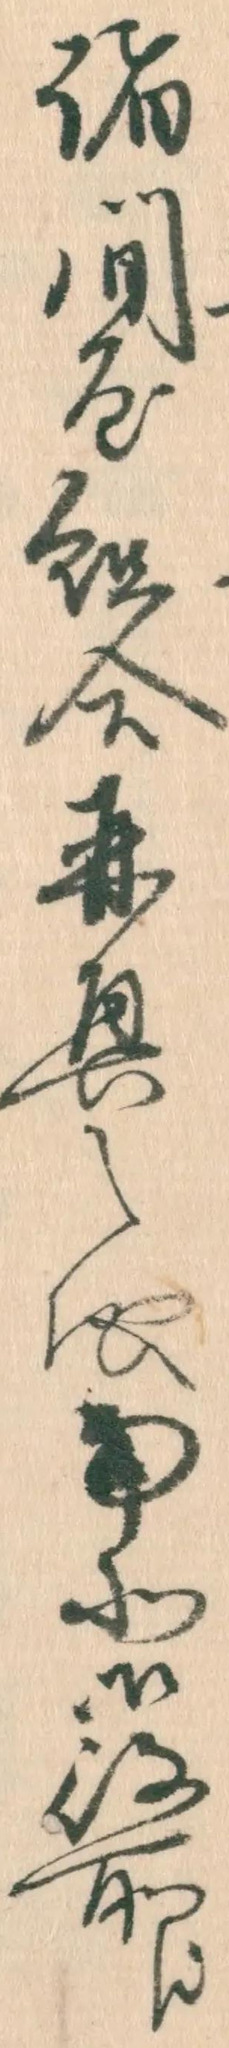諸問屋組合再興之儀南北御役所え
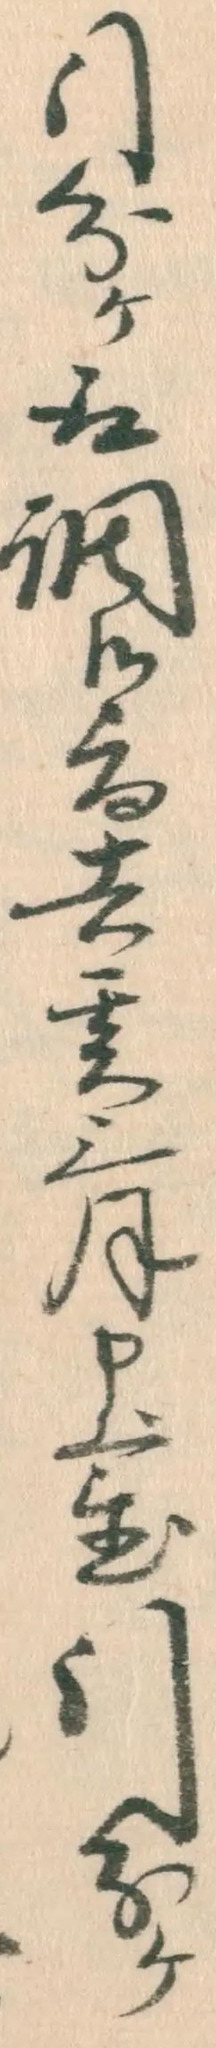引分ケ取調候旨去亥三月申上置引分ケ
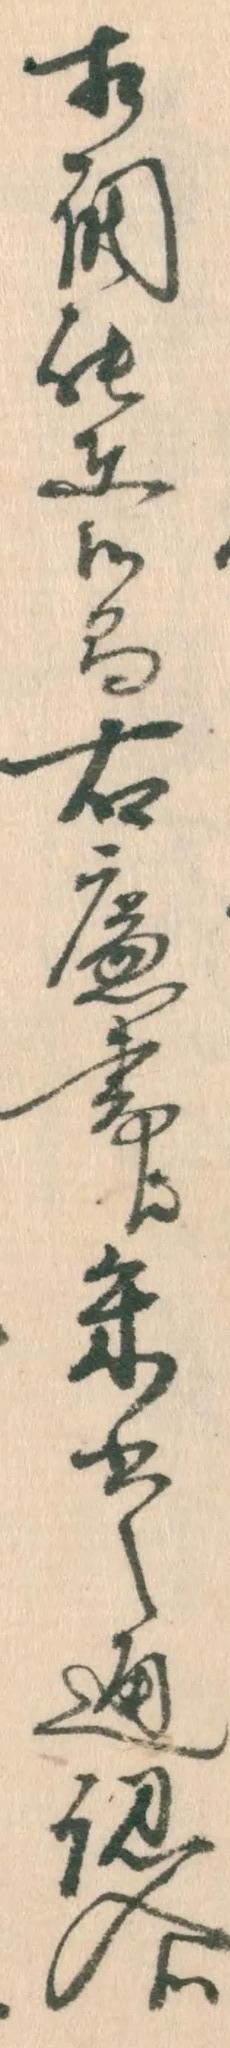相調罷在候間右慮書え朱書之通認入候
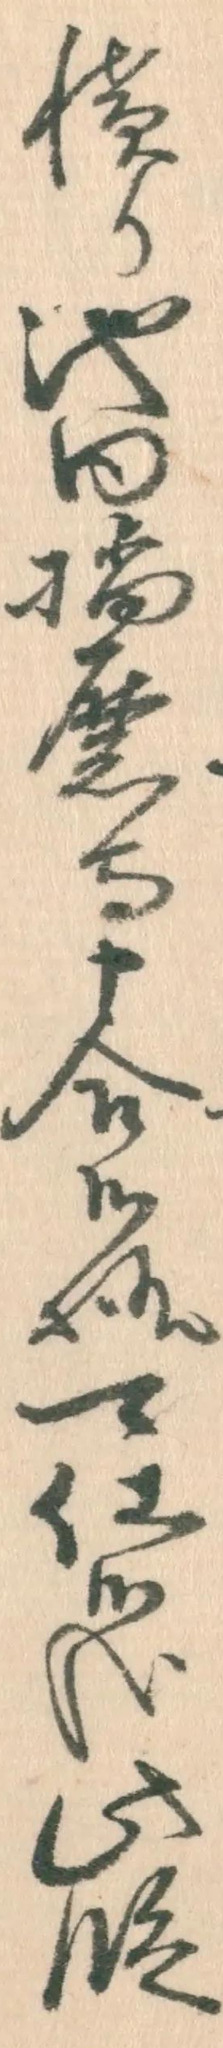積り池田播磨守申合候様可仕候哉此段
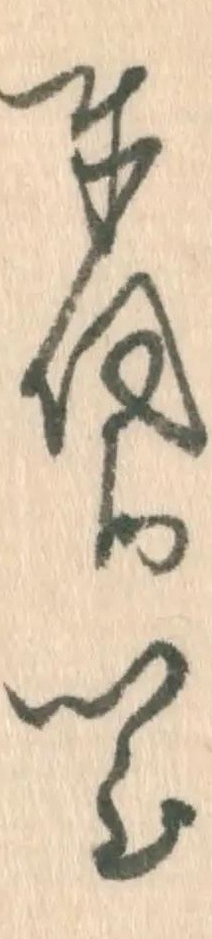奉伺候以上
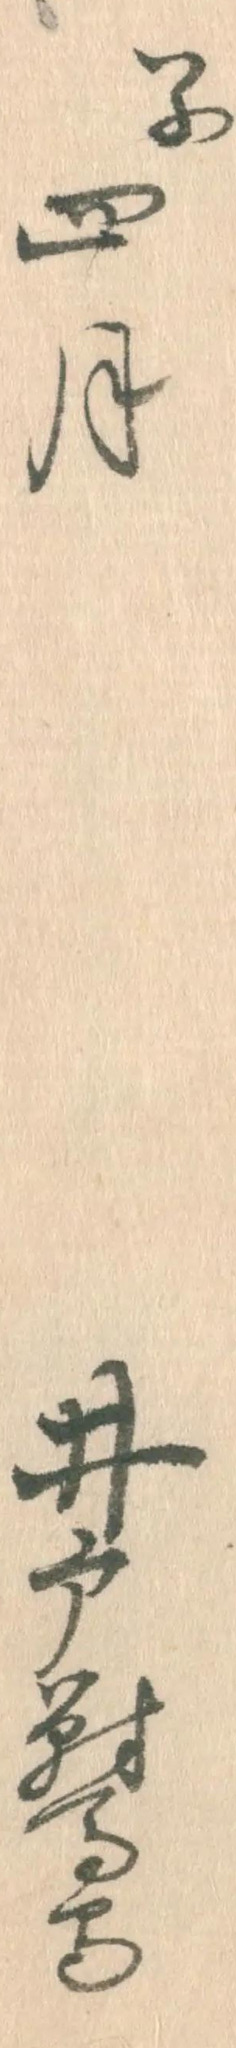子四月井戸対馬守
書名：三橋 17巻. [7] 三橋小破御修復書留　但御奉行御掛リ替地震潰橋番屋　嘉永四亥年より安政二卯年迄　上
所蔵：国立国会図書館 National Diet Library, JAPAN
